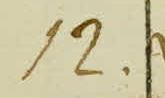12.
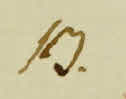3.
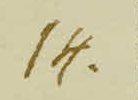14.
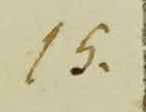15.
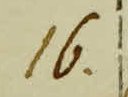16.
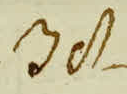38
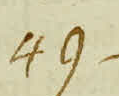49
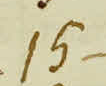15
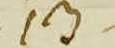13
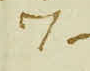7
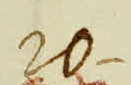20
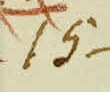15
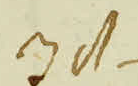38
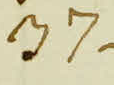37
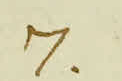7.
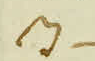3
